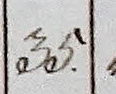35.
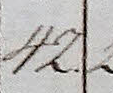42.
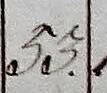53.
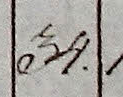34.
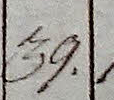39.
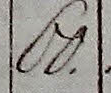60.
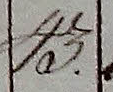43.
